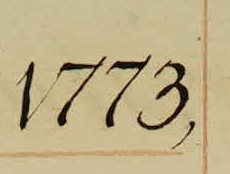1773
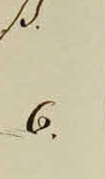6.
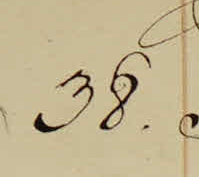38.
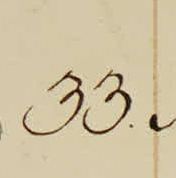33.
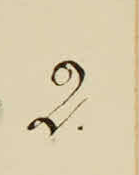2.
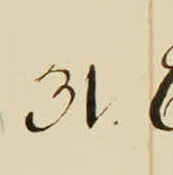31.
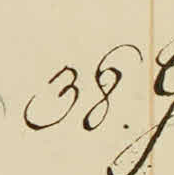38.
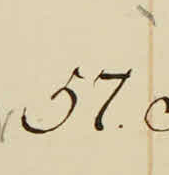57.
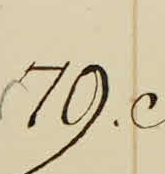79.
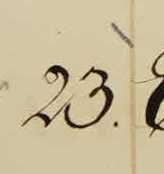23.
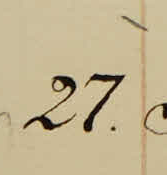27.
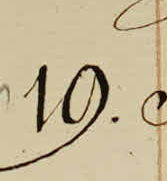19.
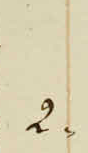2
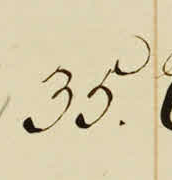35.
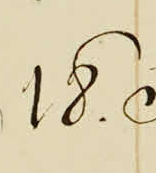18.
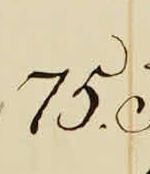75.
